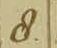8.
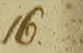16.
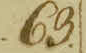63.
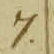7.
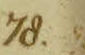78.
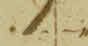1.
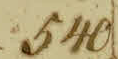540
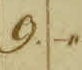9.
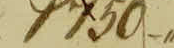1750.
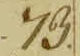73.
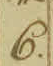6.
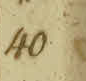40
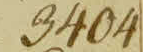3404
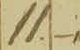11.
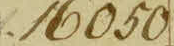16050
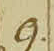9.
